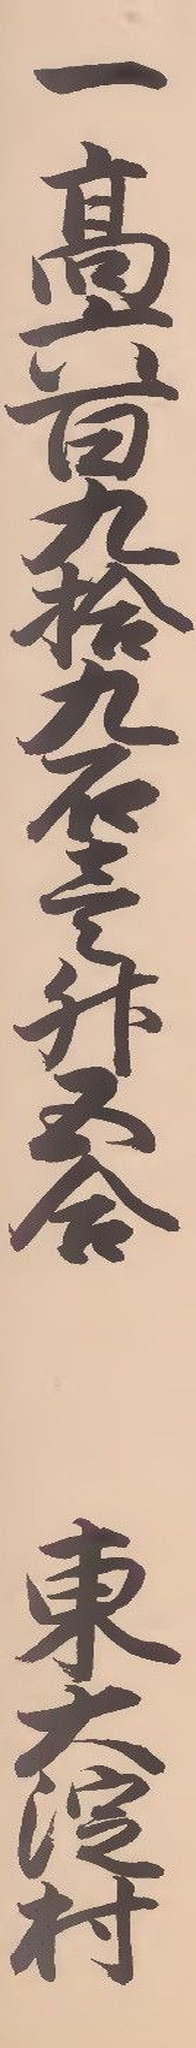一高六百九拾九石壱升五合東大淀村
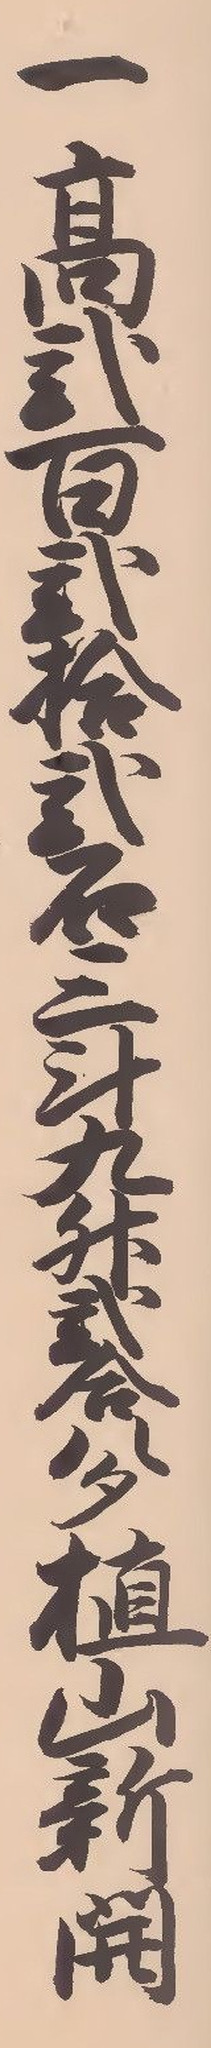一高弐百弐拾弐石三斗九升弐合八勺植山新開
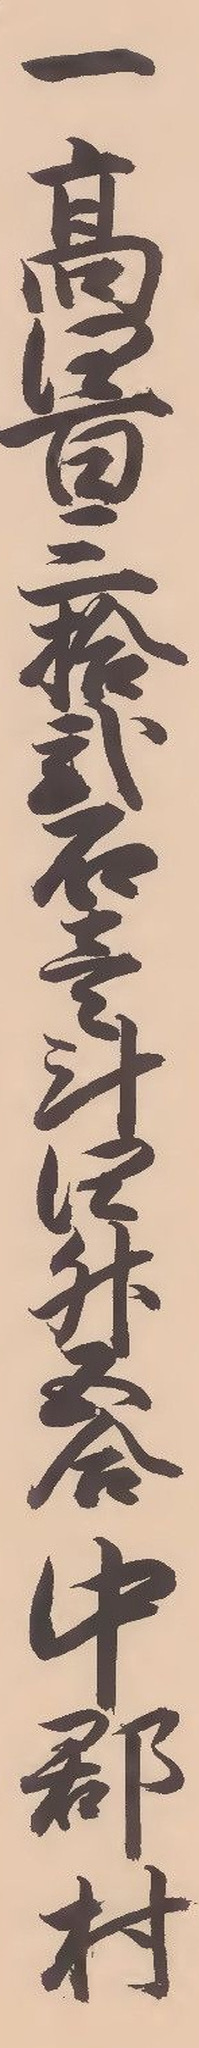一高四百三拾弐石壱斗四升五合中郡村
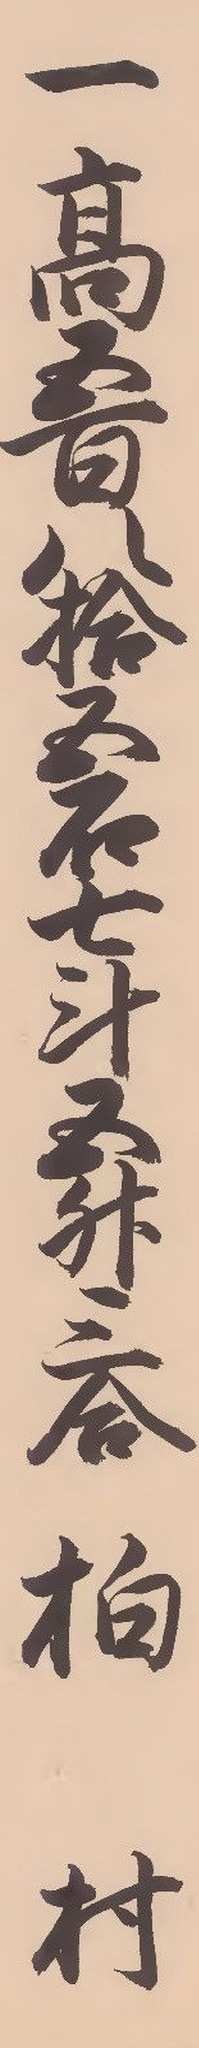一高五百八拾五石七斗五升三合柏村
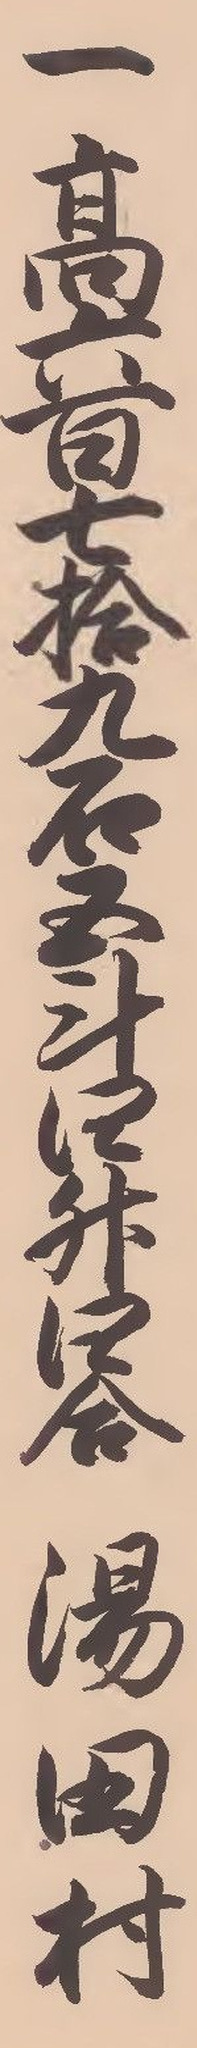一高六百七拾九石五斗四升四合湯田村

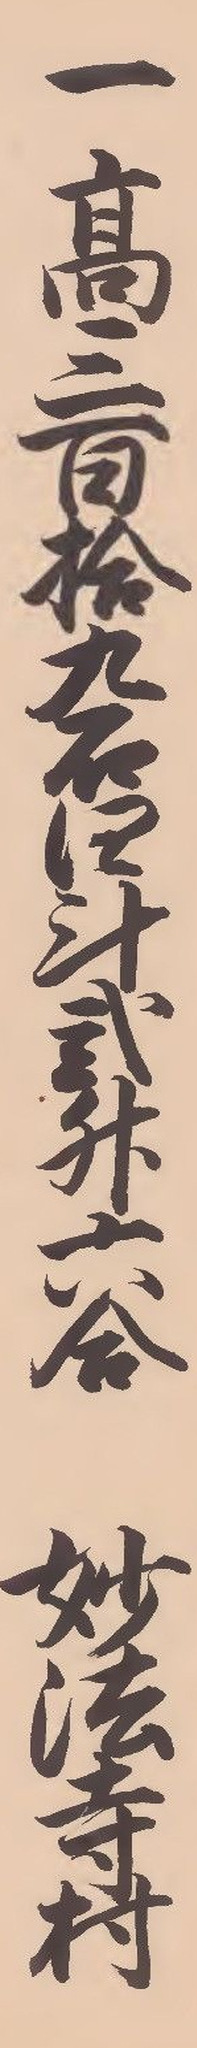一高三百拾九石四斗弐升六合妙法寺村
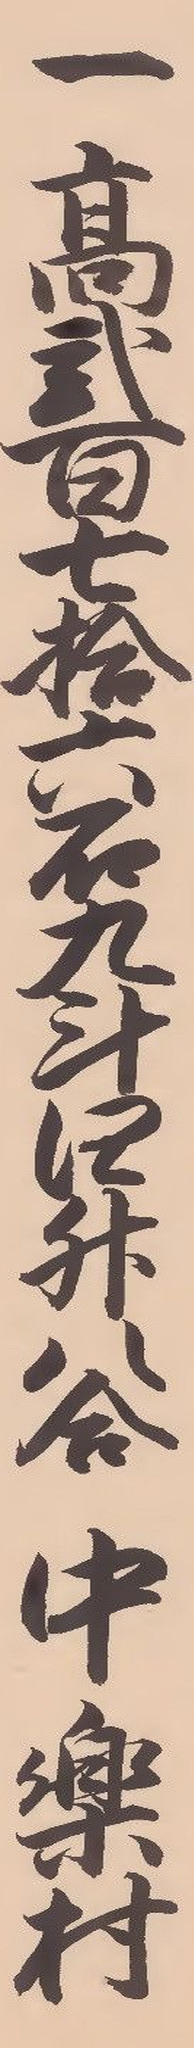一高弐百七拾六石九斗四升八合中楽村
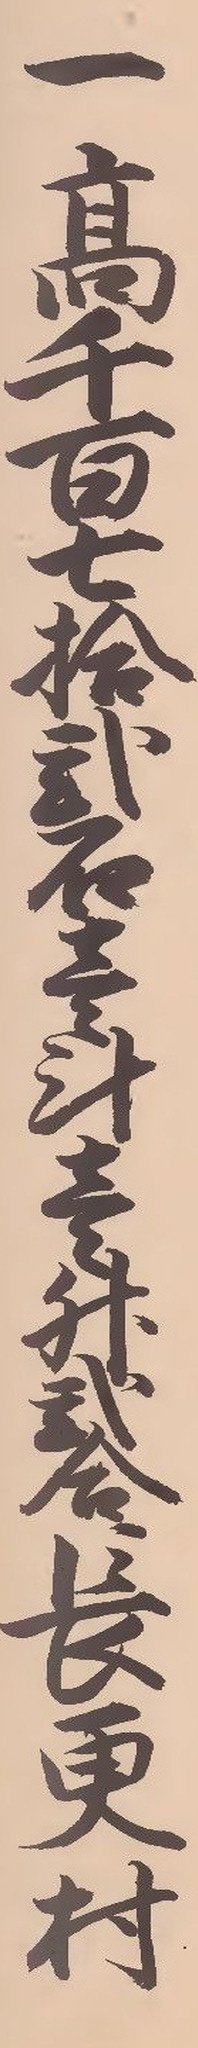一高千百七拾弐石壱斗壱升弐合長更村
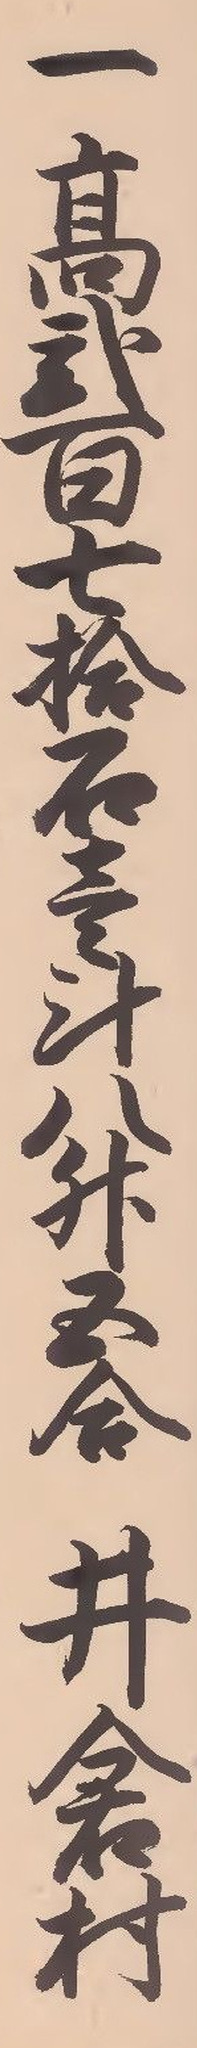一高弐百七拾石壱斗八升五合井倉村
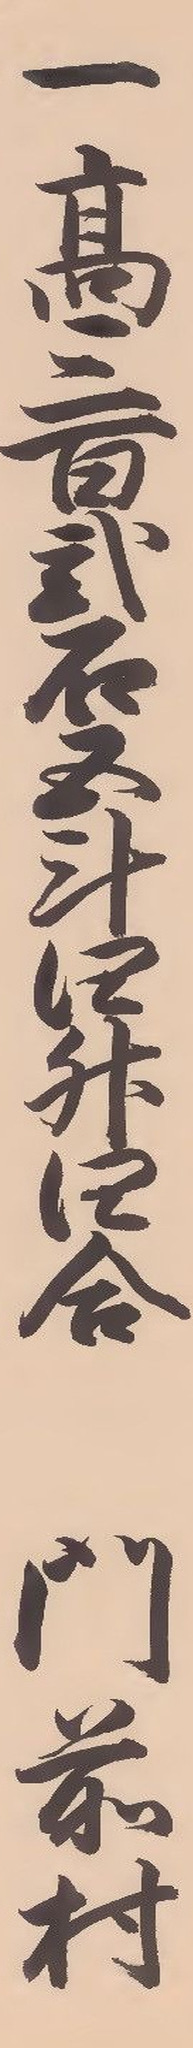一高三百弐石五斗四升四合門前村
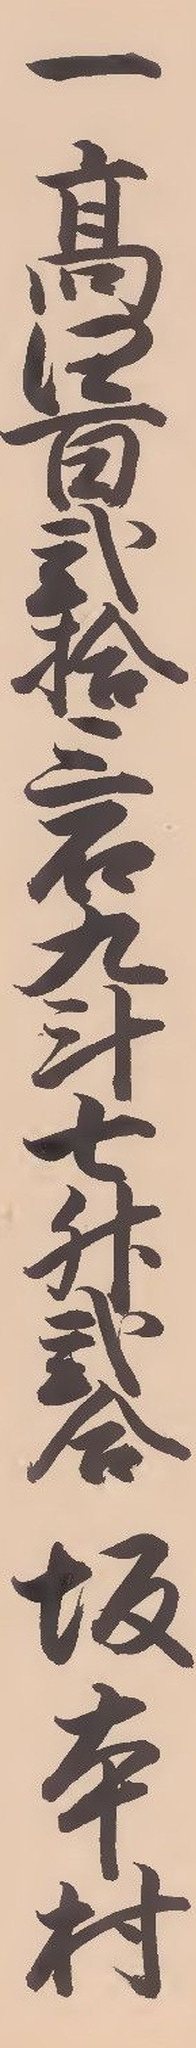一高四百弐拾三石九斗七升弐合坂本村
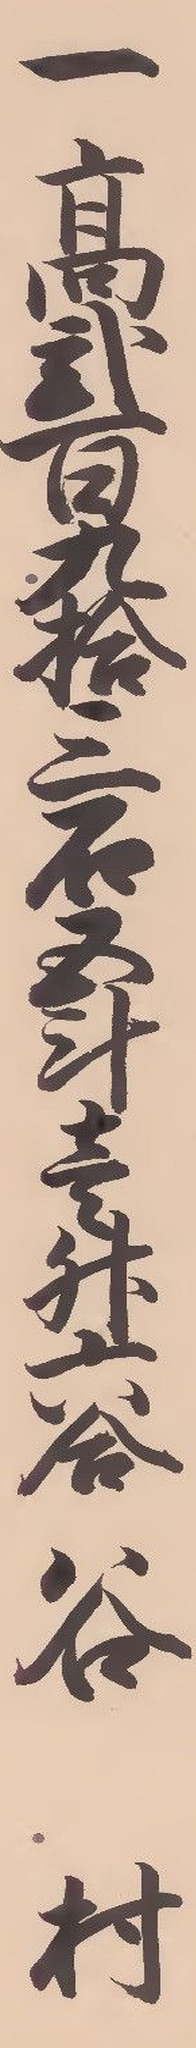一高弐百九拾三石五斗壱升六合谷村

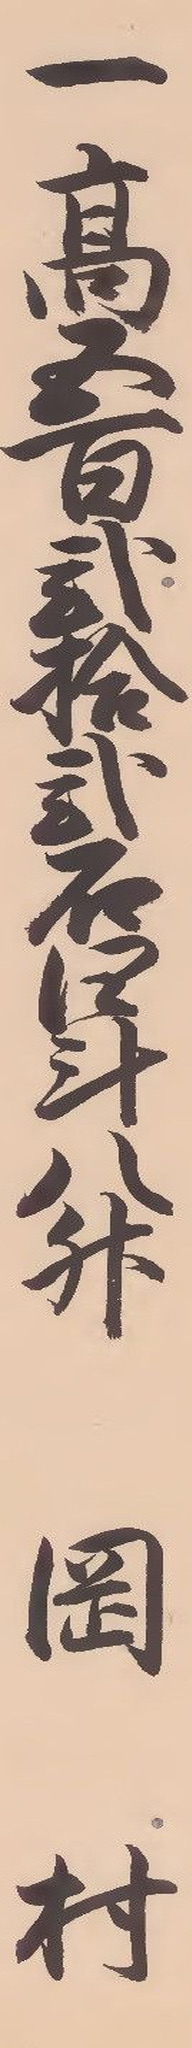一高五百弐拾弐石四斗八升岡村
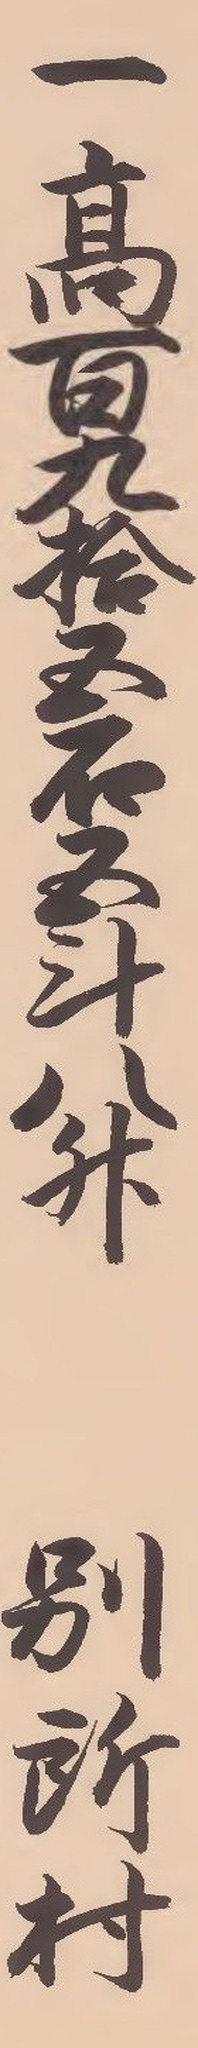一高百九拾五石五斗八升別所村
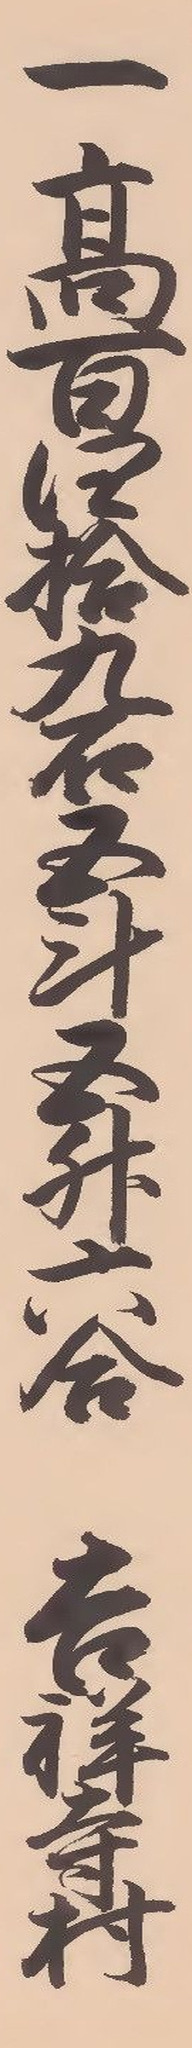一高百四拾九石五斗五升六合吉祥寺村
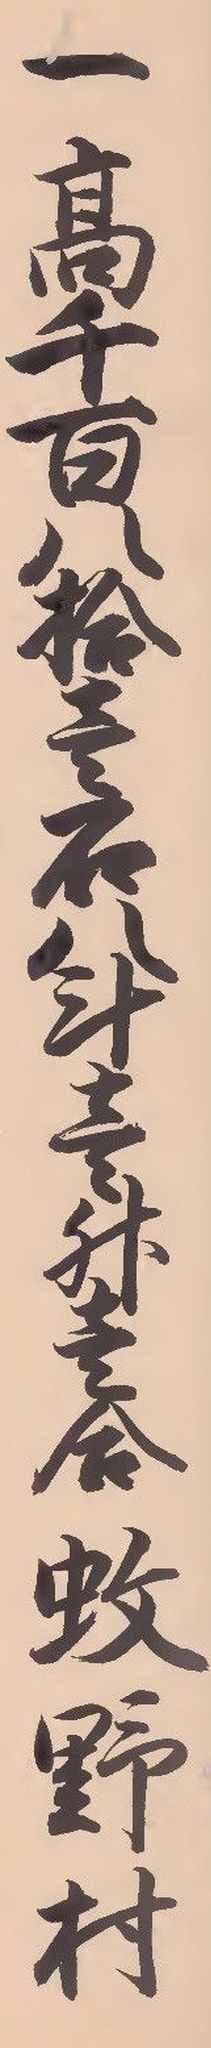一高千百八拾壱石八斗壱升壱合蚊野村
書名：伊勢国郷帳
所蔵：国立公文書館 National Archives of Japan
